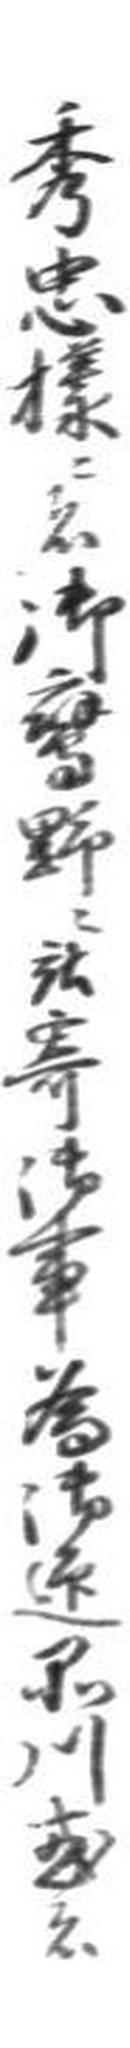秀忠様ニ者御鷹野ニ被寄御事為御迎品川或者
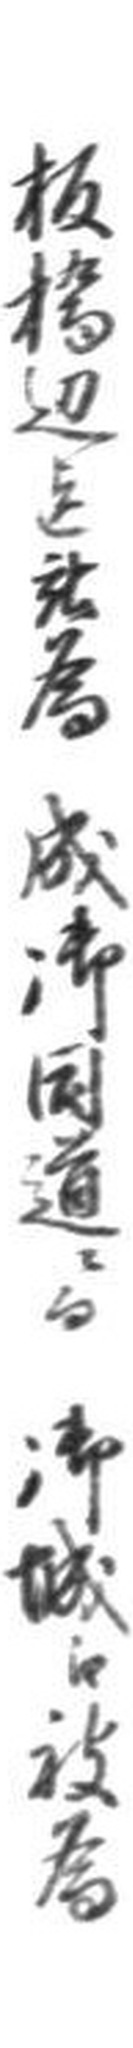板橋辺迄被為成御同道ニ而御城江被為

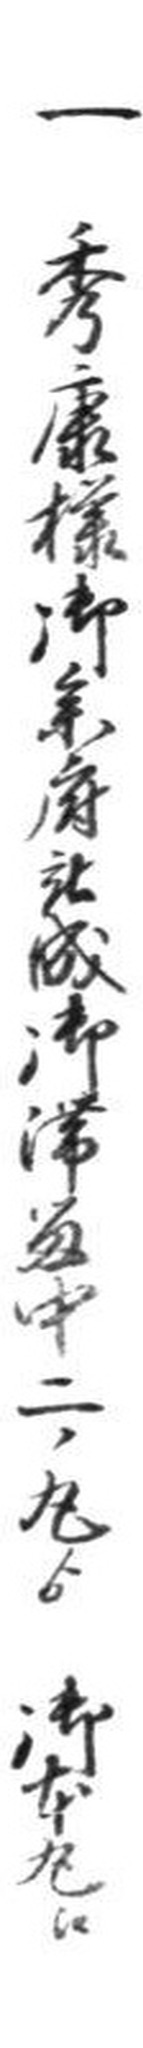一秀康様御参府被成御滞留中二ノ丸ゟ御本丸江
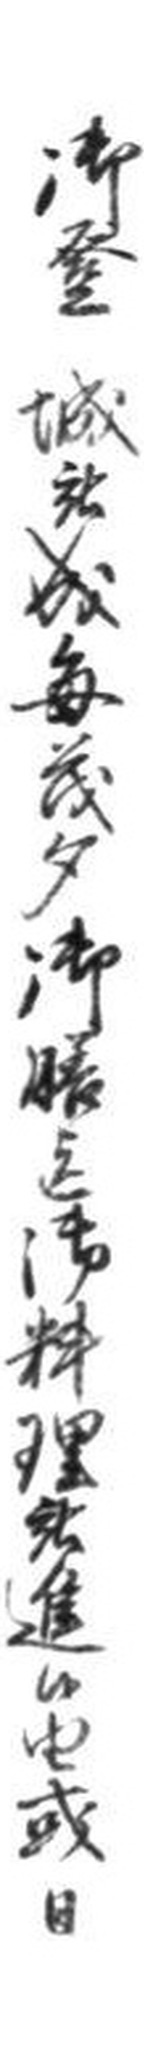御登城被成毎も夕御膳迄御料理被進候由或日
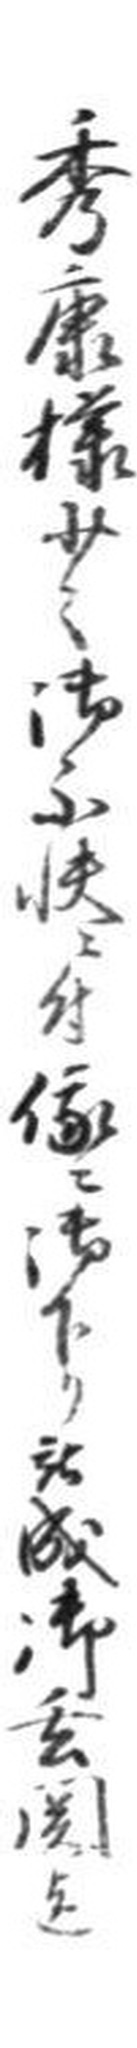秀康様少々御不快ニ付俄ニ御下リ被成御玄関迄
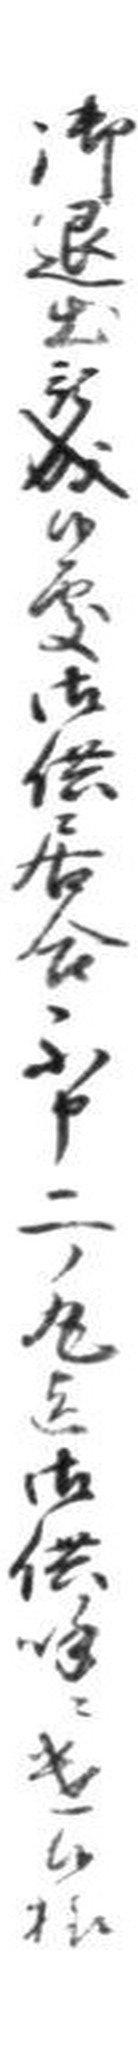御退出被成候処御供居合不申二ノ丸迄御供呼ニ遣候様
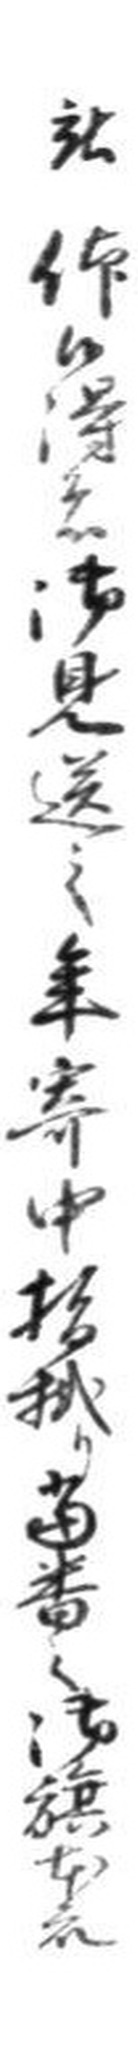被仰候得者御見送之年寄中指掛リ当番之御旗本衆
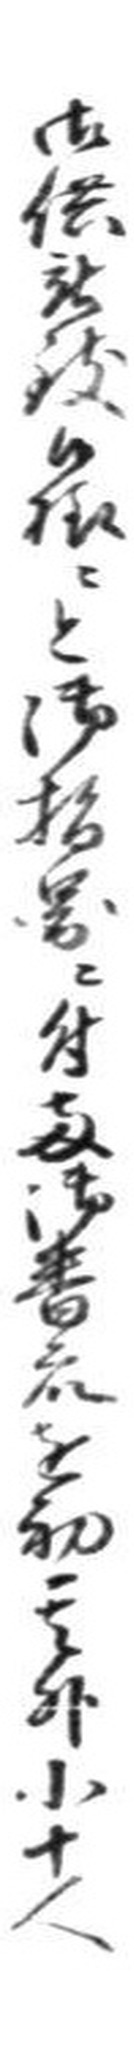御供被致候様ニと御指図ニ付両御番衆を初其外小十人
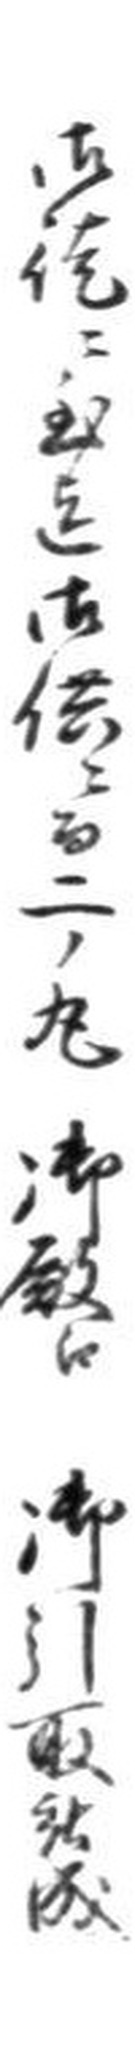御徒ニ至迄御供ニ而二ノ丸御殿江御引取被成
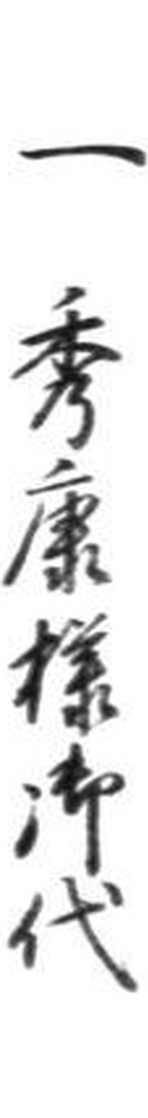一秀康様御代
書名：家譜 一 秀康公 従天正二年到慶長十二年
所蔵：福井県文書館 Fukui Prefectural Archives
